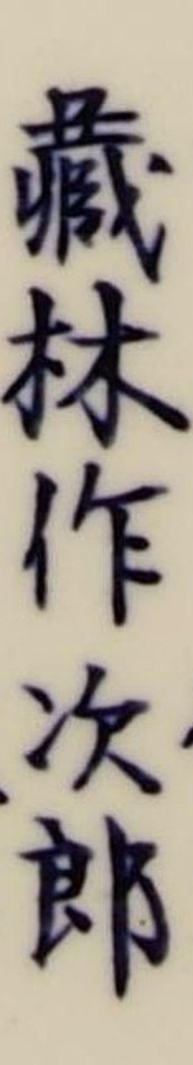蔵林作次郎
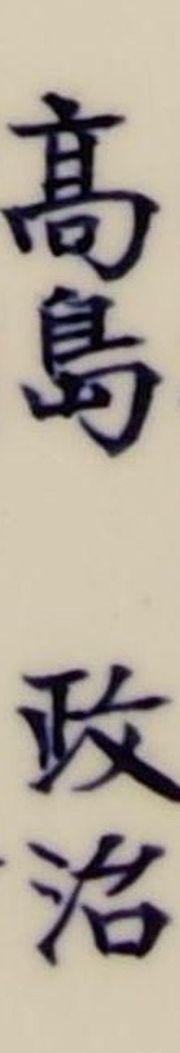高島政治
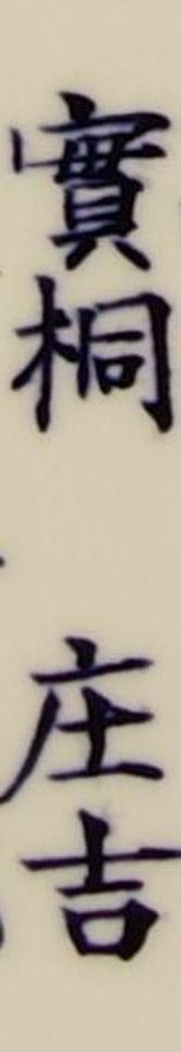實桐庄吉
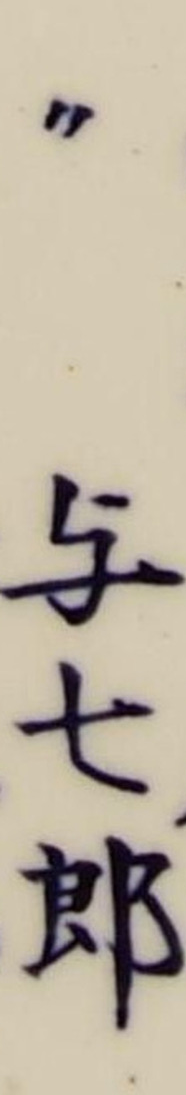与七郎
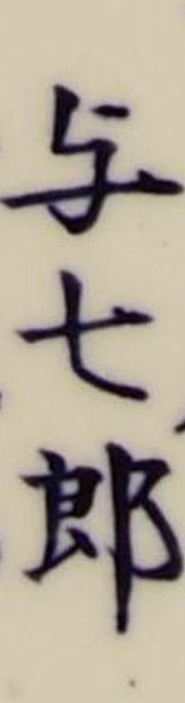与七郎
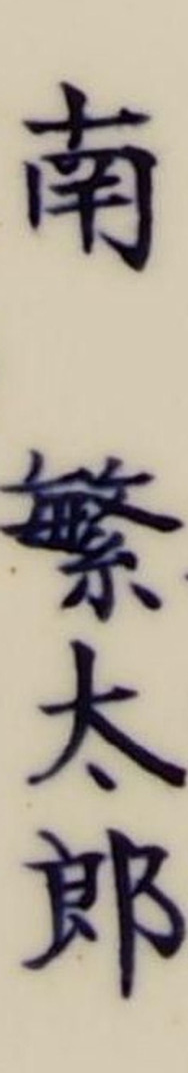南繁太郎
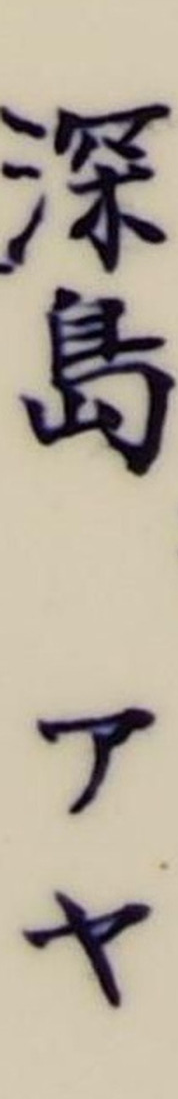深島アヤ
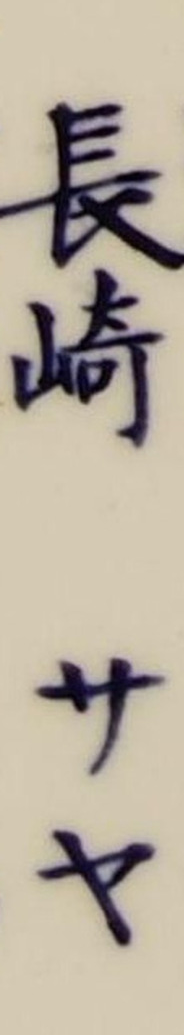長崎サヤ
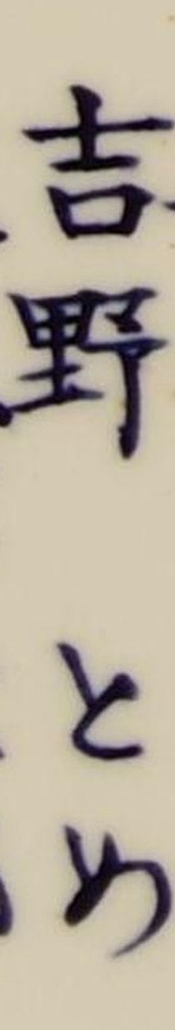吉野とめ
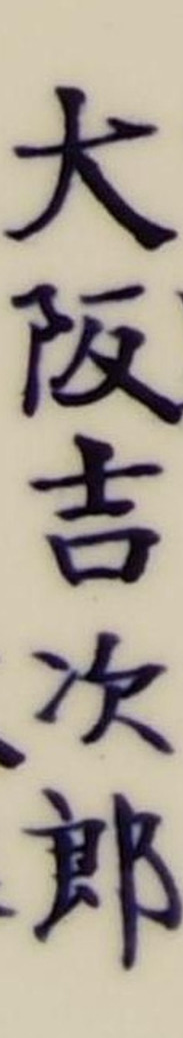大阪吉次郎
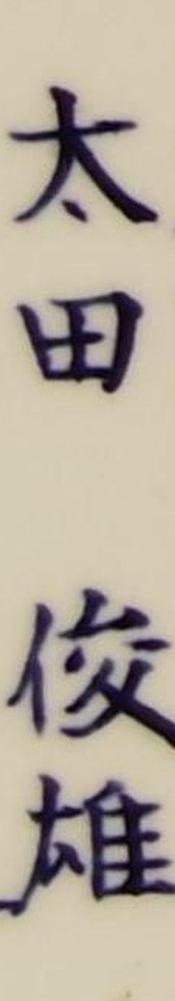太田俊雄
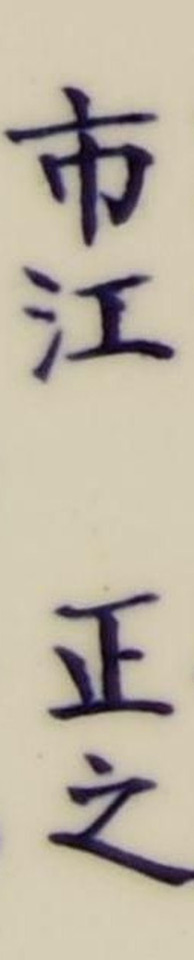市江正之
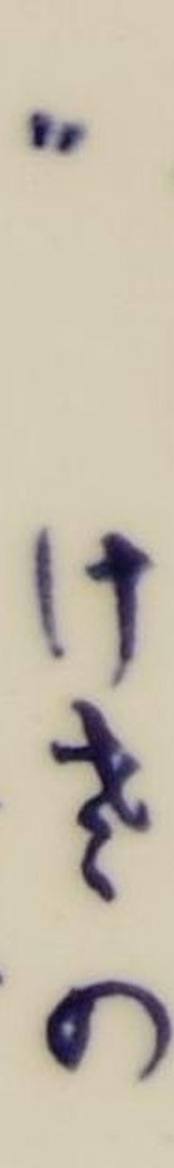けさの
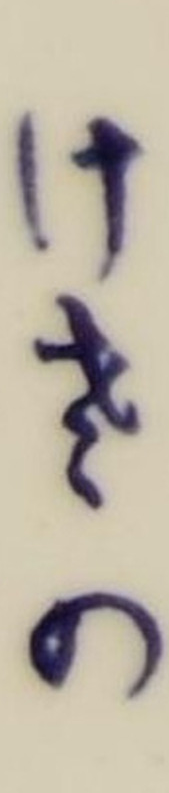けさの
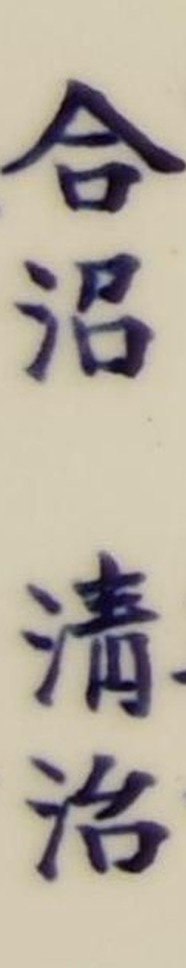合沼清治
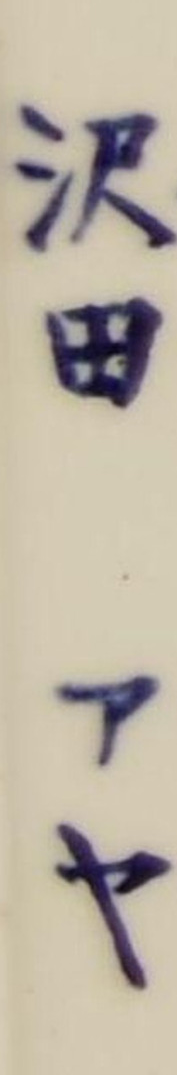沢田アヤ
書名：A~D
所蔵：koyasan kongobuji
